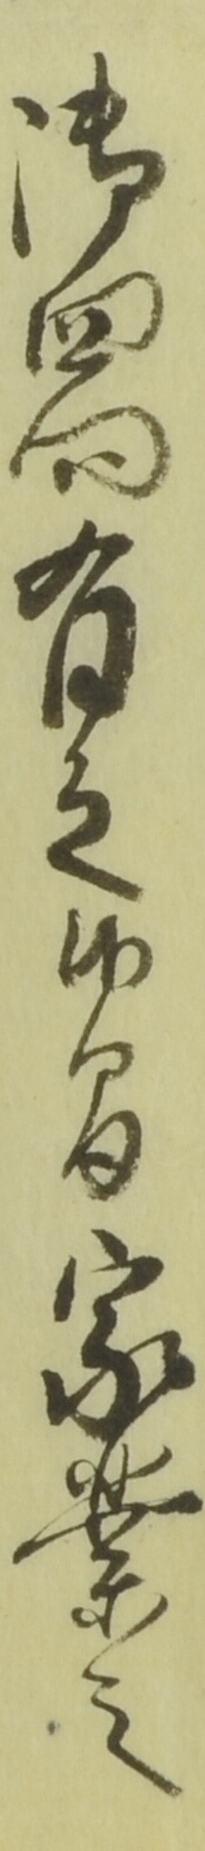御回向有之候間家業之
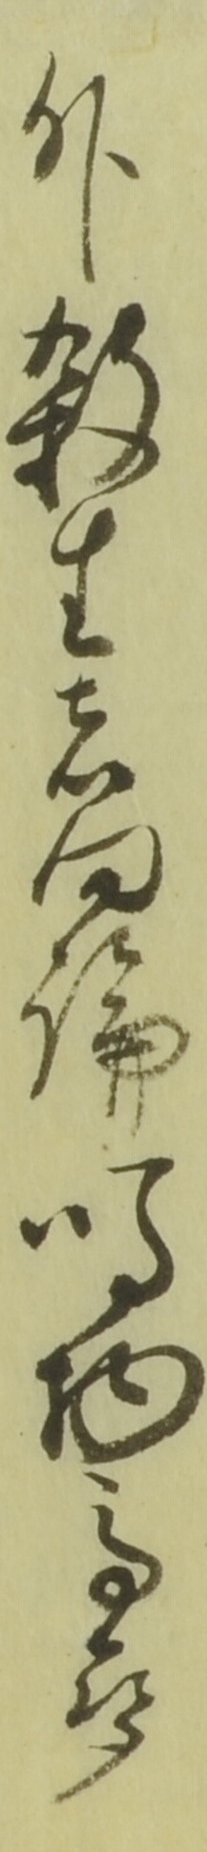外殺生は勿論鳴物高声
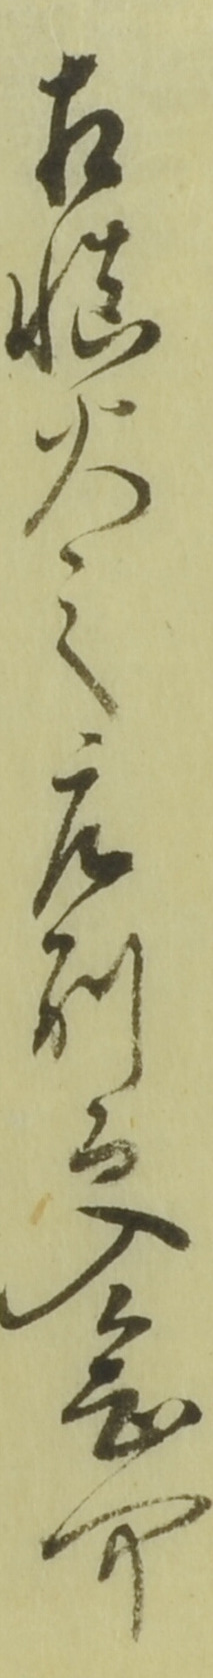相慎火之元利而入念可
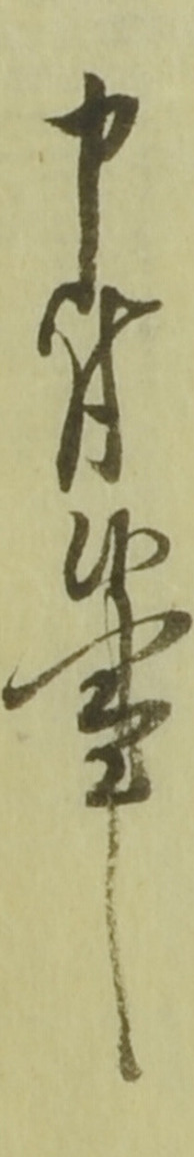申付候事
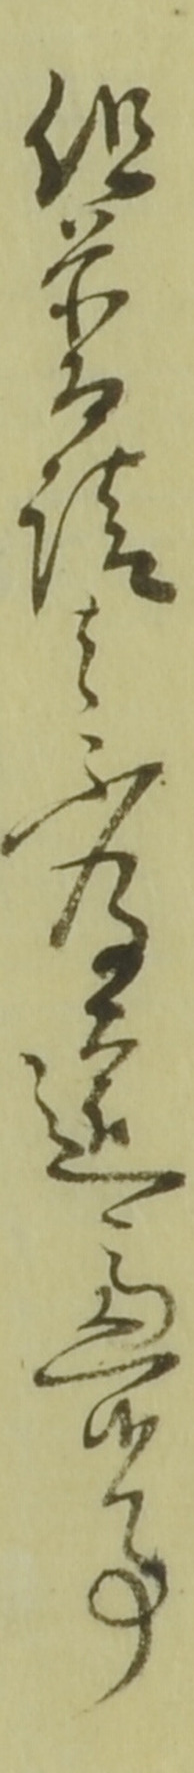但普請は不及遠慮候事
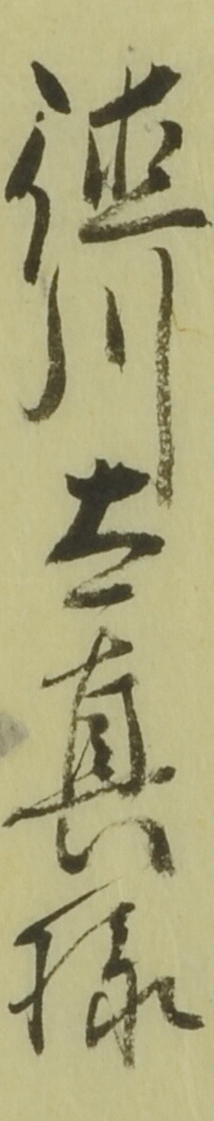徳川太真様
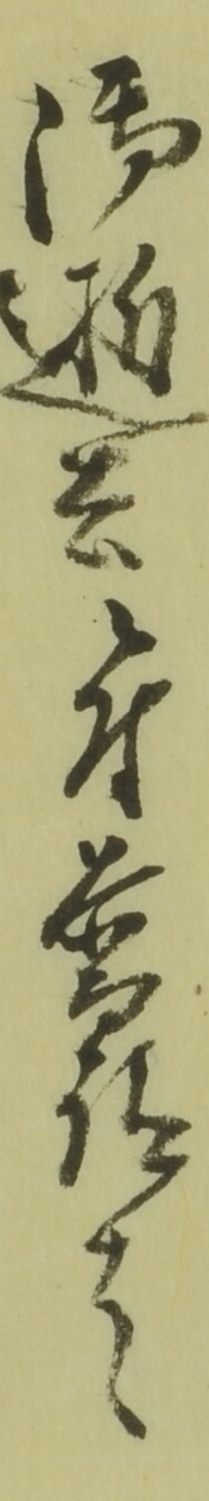御逝去ニ付普請は
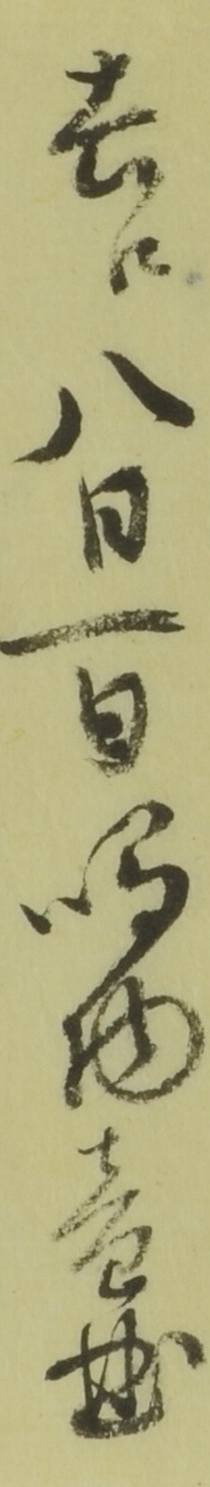去ル八月一日鳴物音曲
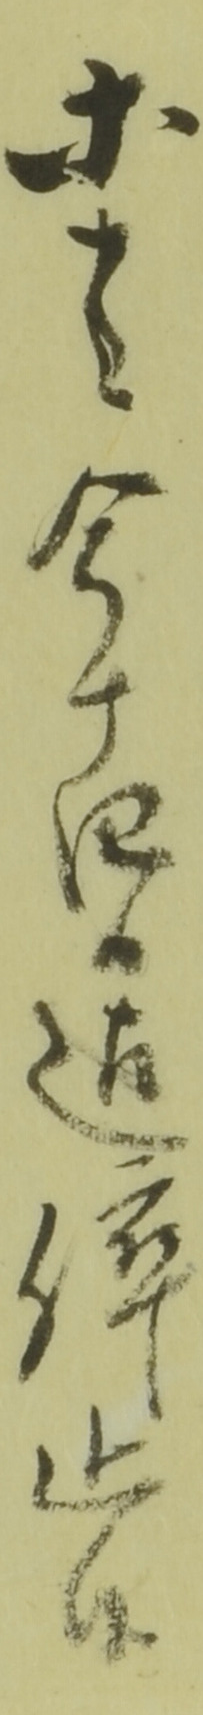等は今十四日迄停止候
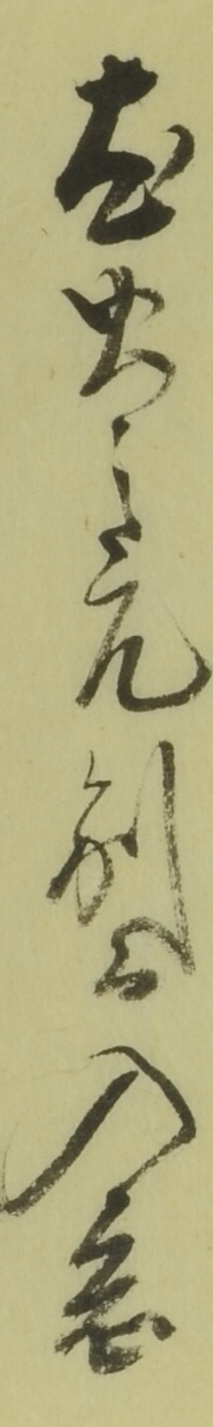尤火之元別而入念
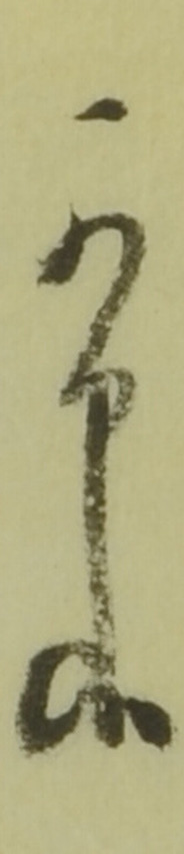可申候

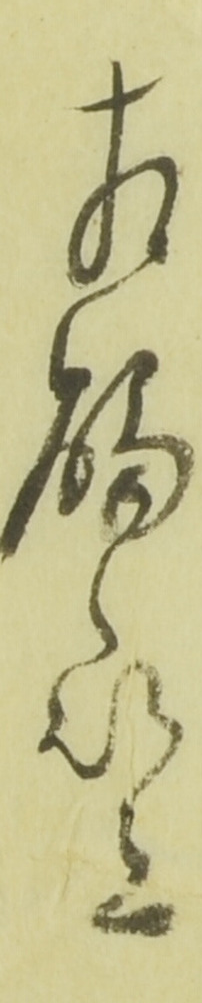相触候以上
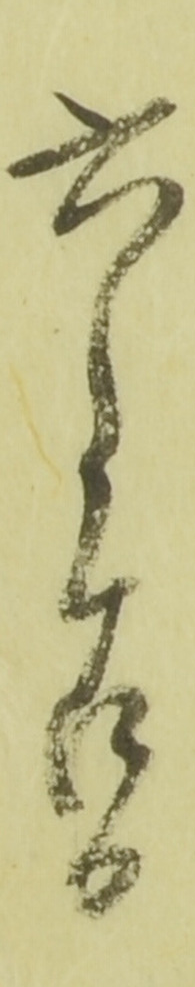六月十四日
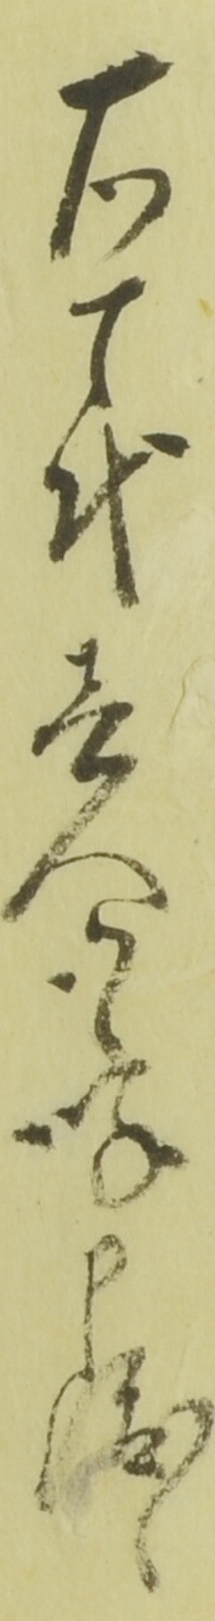右丁代壱人御呼申渡候
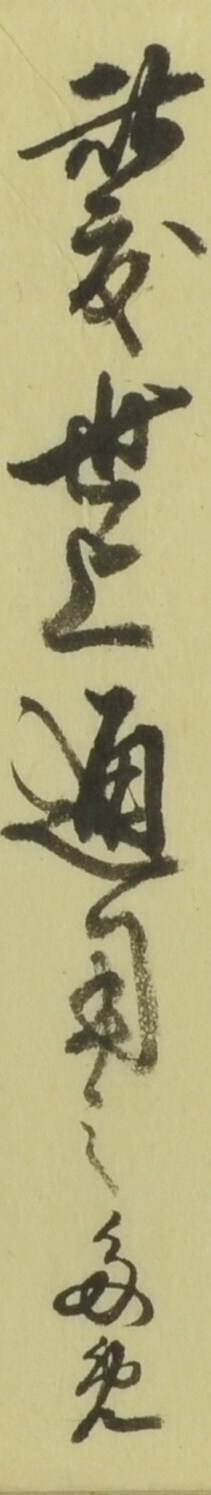此度世上通用之ため
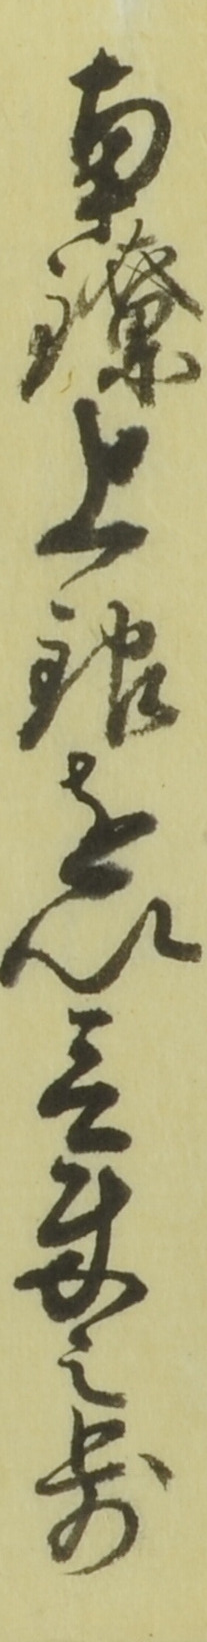南鐐上銀を以壱朱之歩
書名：御触書御書附控
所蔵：伊那市立高遠町図書館・合同会社AMANE
